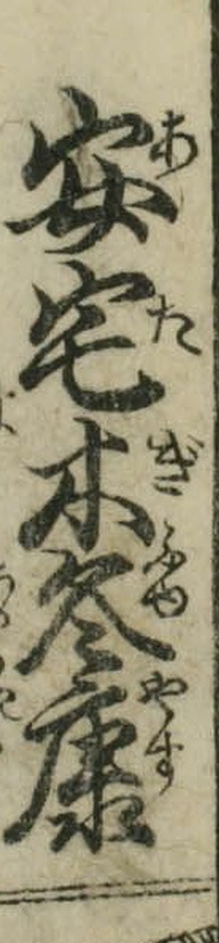安宅木冬康
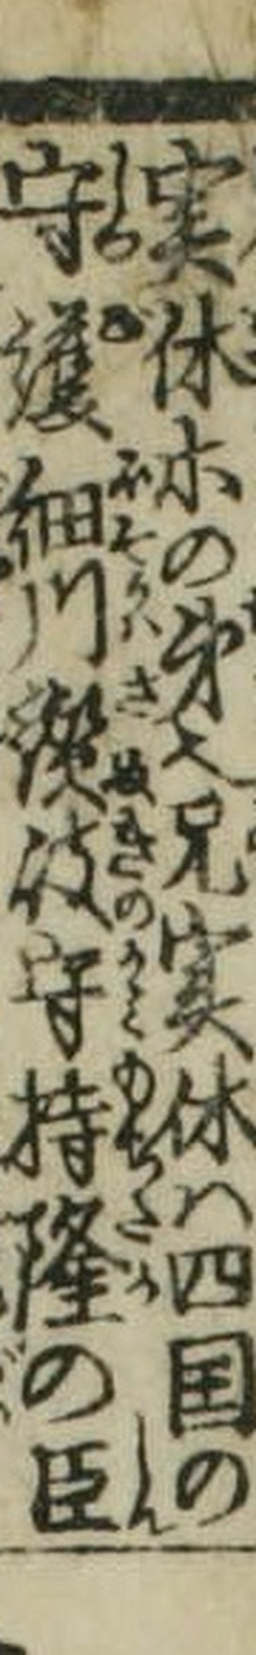守護細川讃岐守持隆の臣
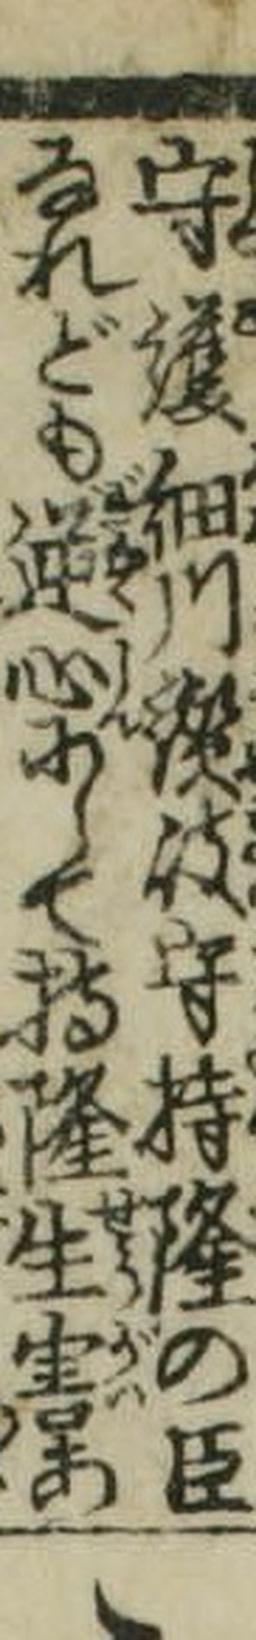なれども逆心にして持隆生害あ
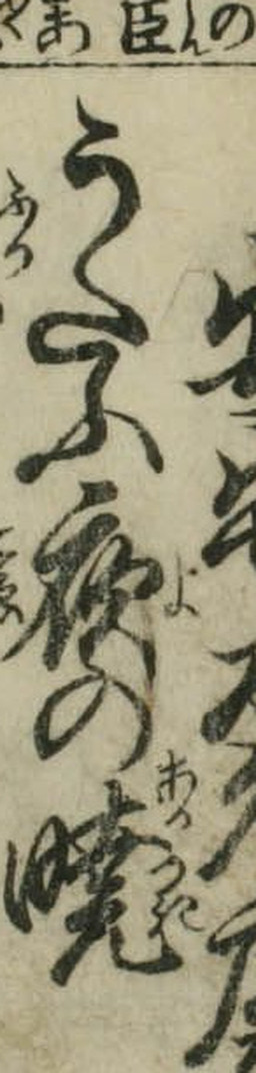うたふ夜の暁
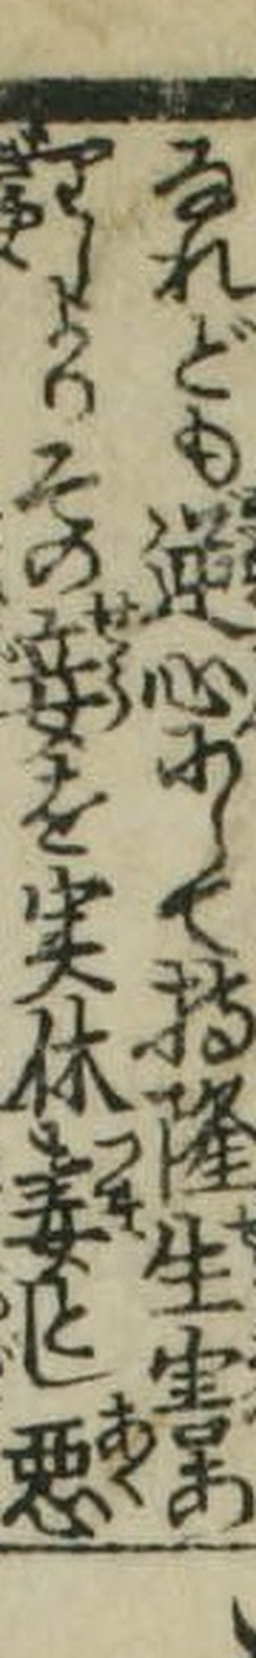りしよりその妾を実休妻とし悪
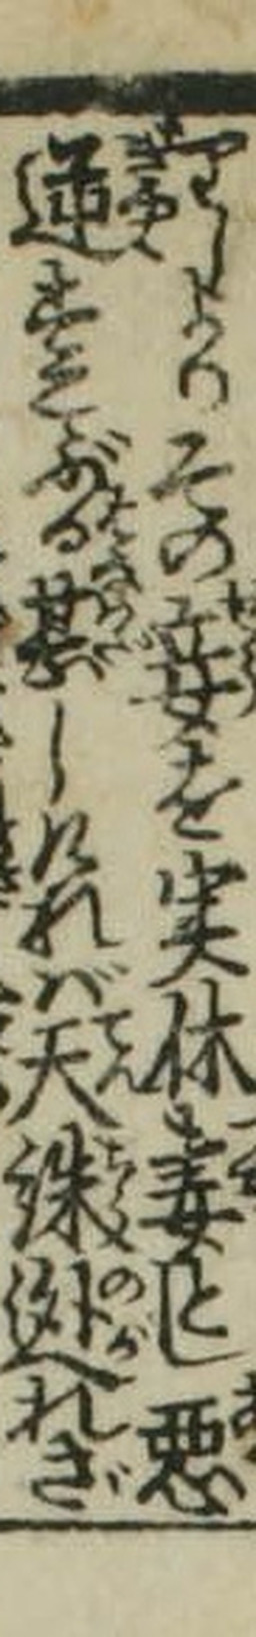逆すこぶる甚しければ天誅逃れざ
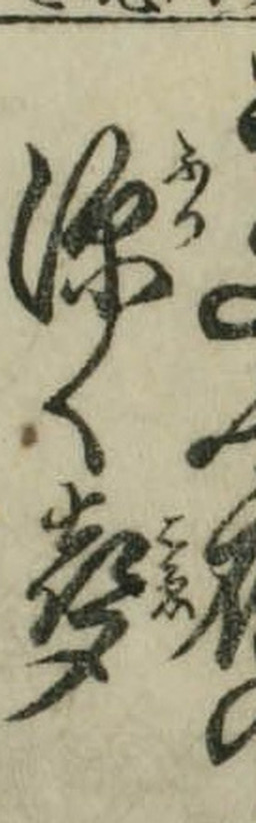深く声
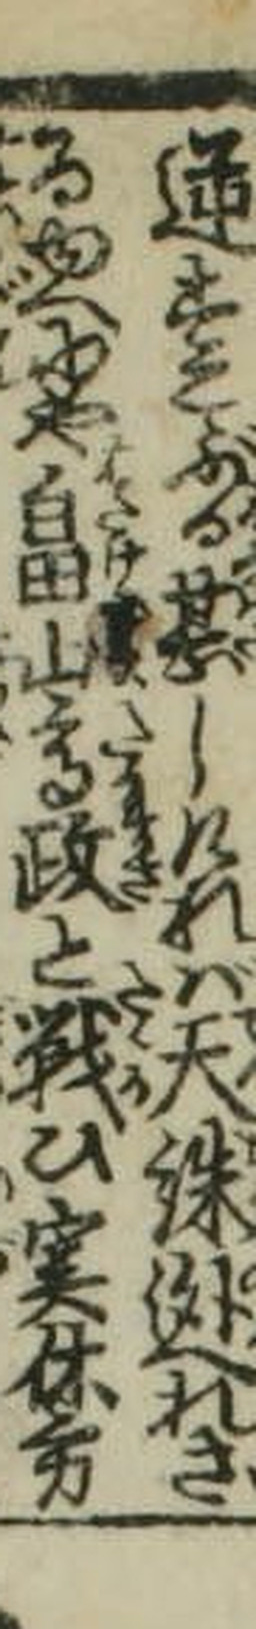るゆへにや畠山高政と戦ひ実休方
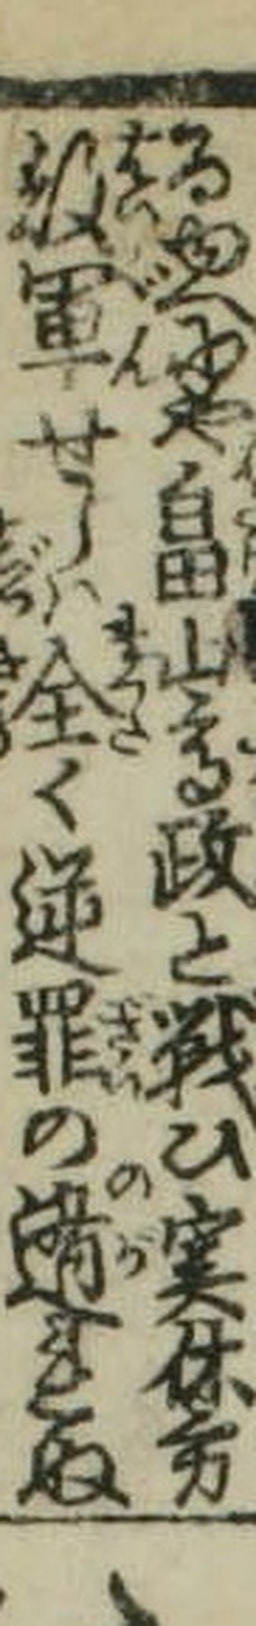敗軍せしは全く逆罪の遁れぬ
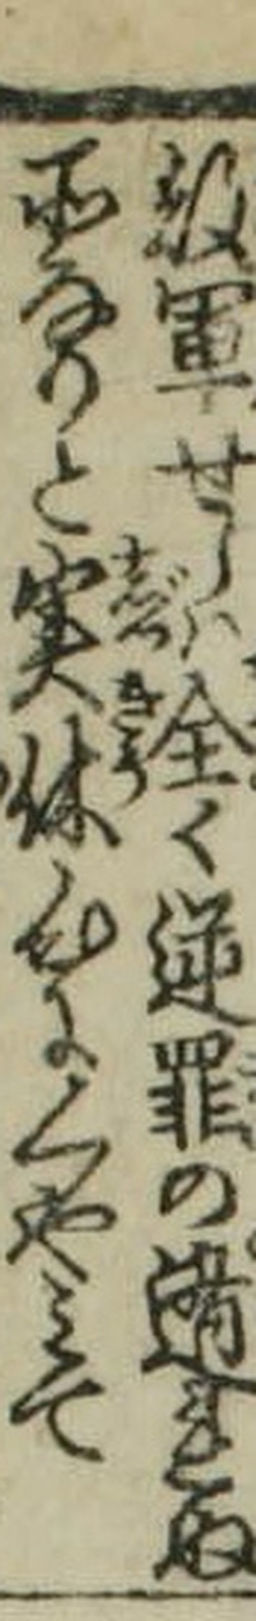所なりと実休心にくやみて
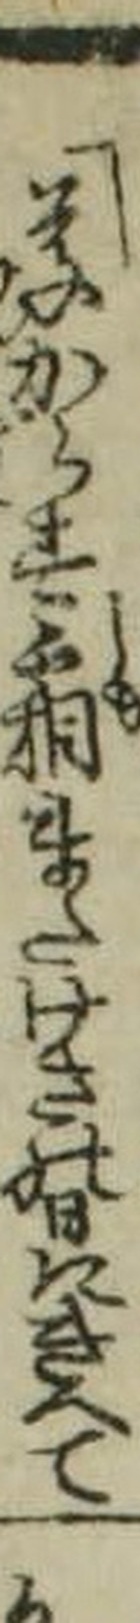〽草からす霜またけさの日にきへて
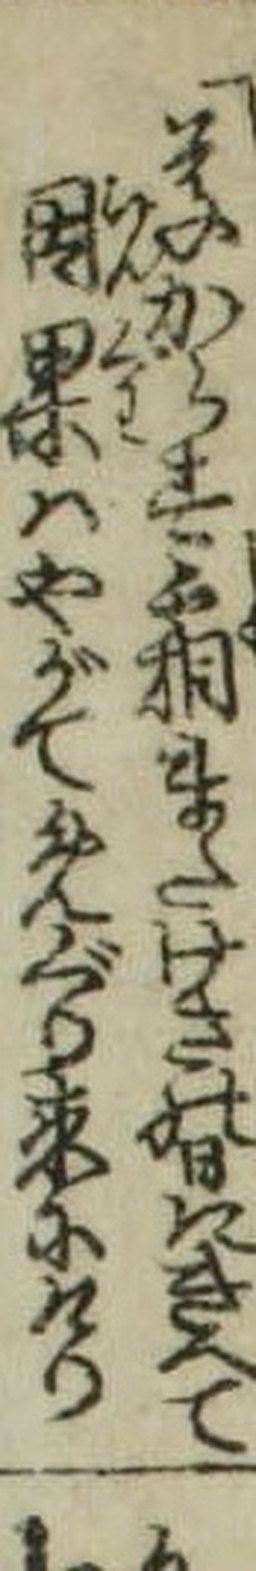因果はやがてめぐり来にけり
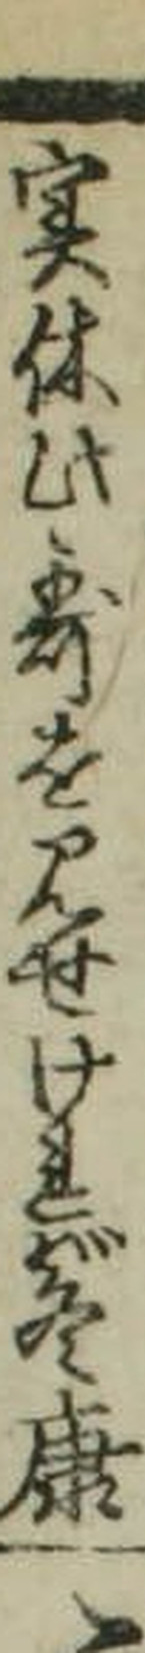実休此歌を見せければ冬康
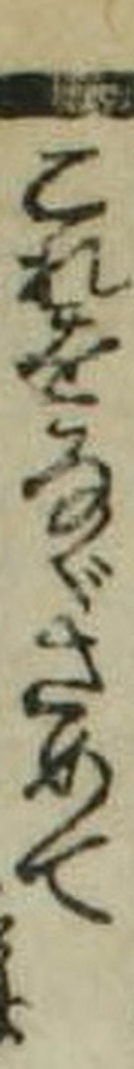これをなぐさめて
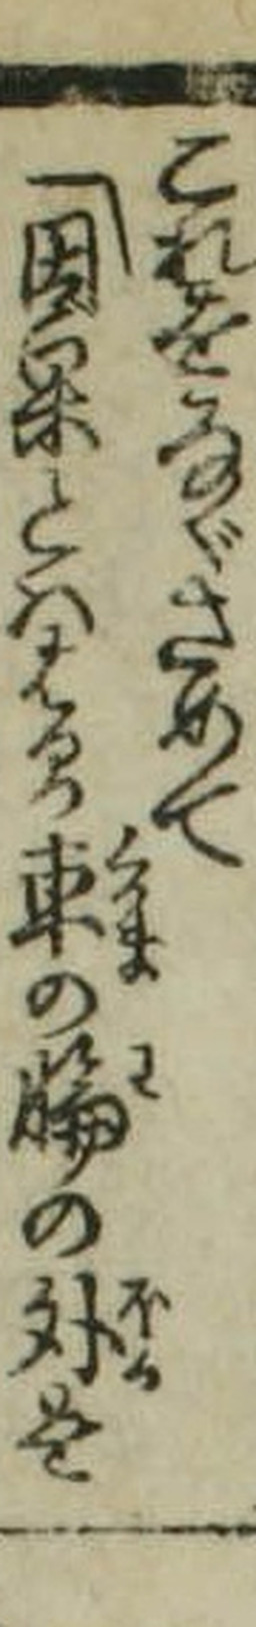〽因果とははるか車の輪の外を
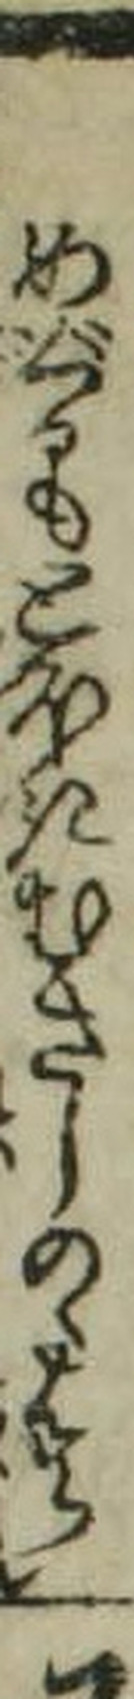めぐるもとほきむさしのゝはら
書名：續英雄百人一首
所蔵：東京学芸大学附属図書館
